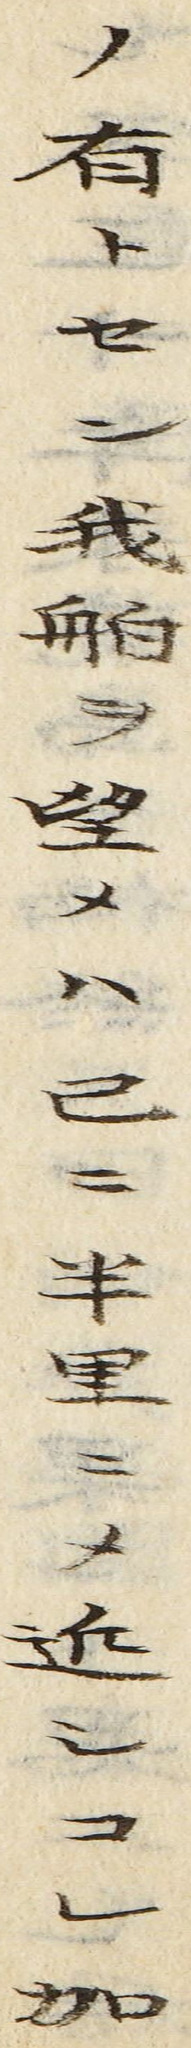ノ有トセン我舶ヲ望メハ已ニ半里ニシテ近シコレ加
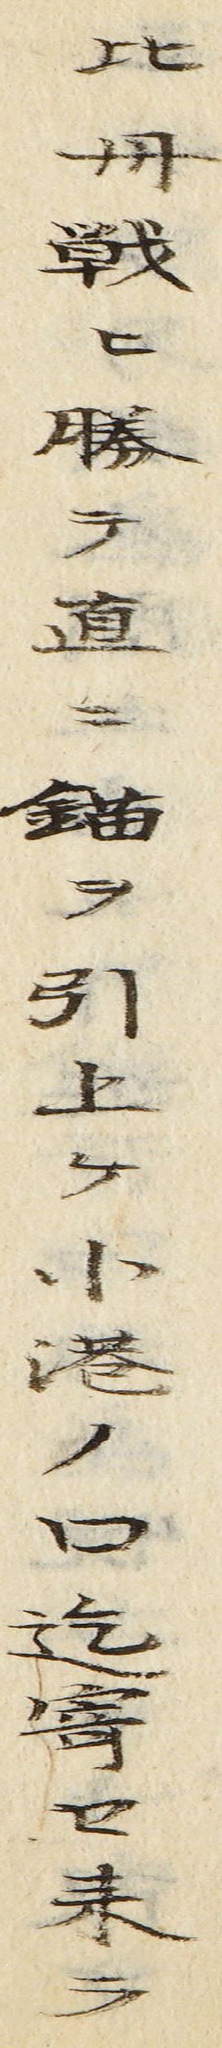比丹戦ヒ勝テ直ニ錨ヲ引上ケ小港ノ口迄寄セ来ラ

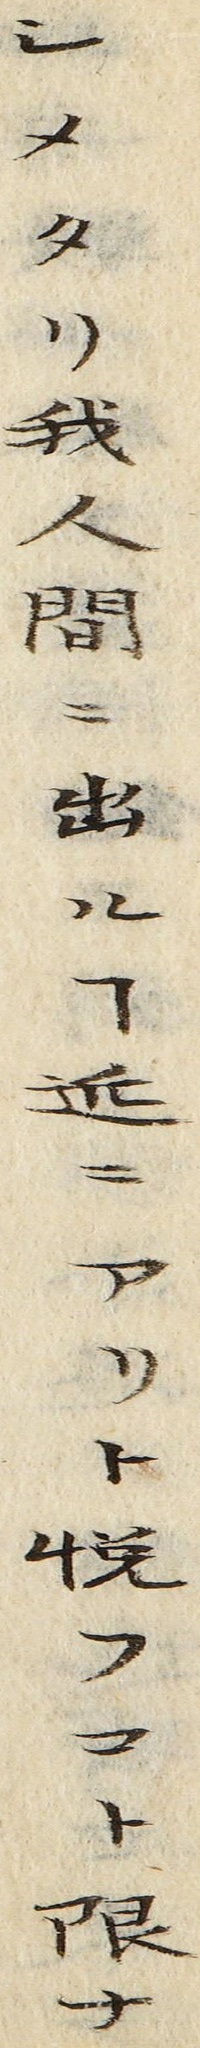シメタリ我人間ニ出ルコト近ニアリト悦フコト限ナ
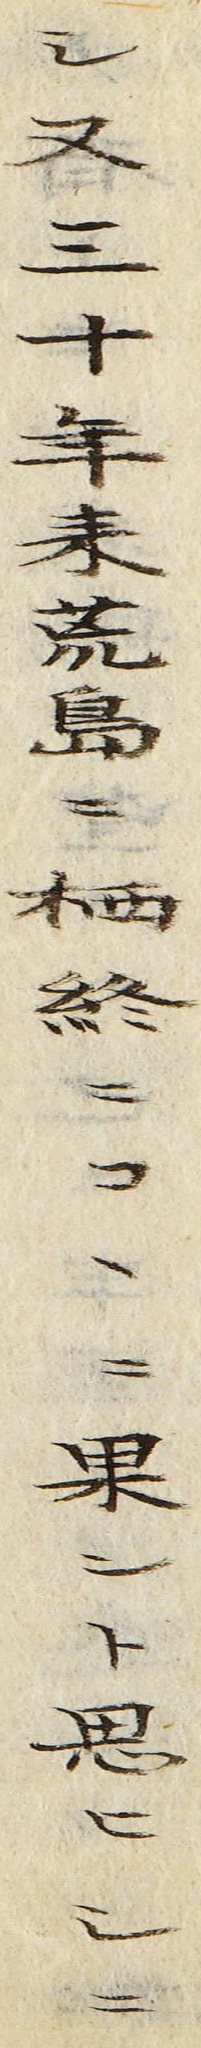シ又三十年来荒島ニ栖終ニコヽニ果ント思ヒシニ
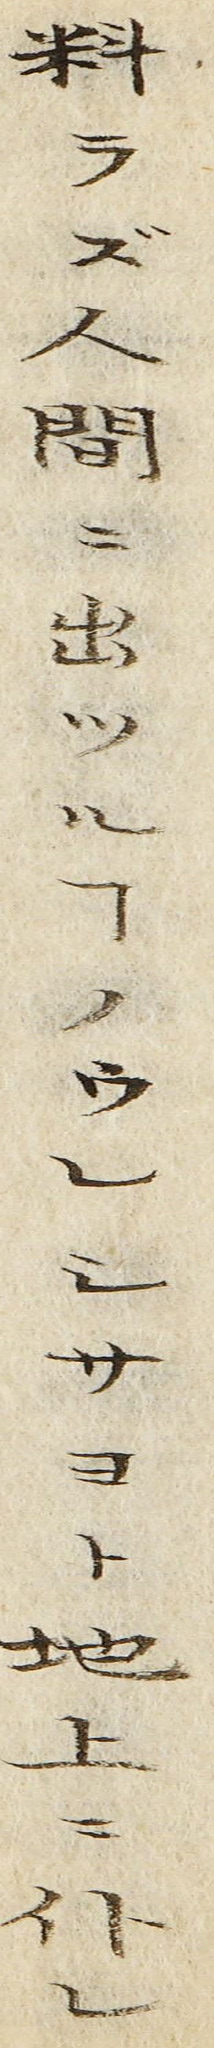料ラズ人間ニ出ツルコトノウレシサヨト地上ニ仆レ
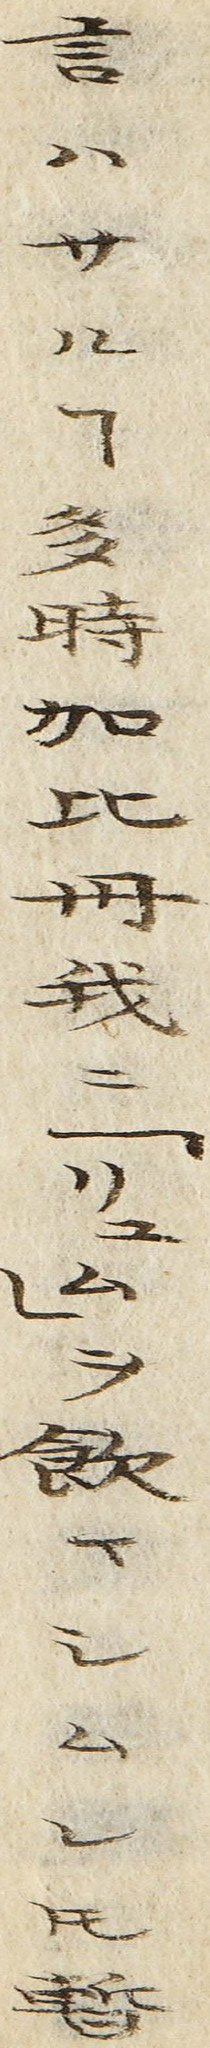言ハサルコト多時加比丹我ニ「リュム」ヲ飲マシムレトモ暫
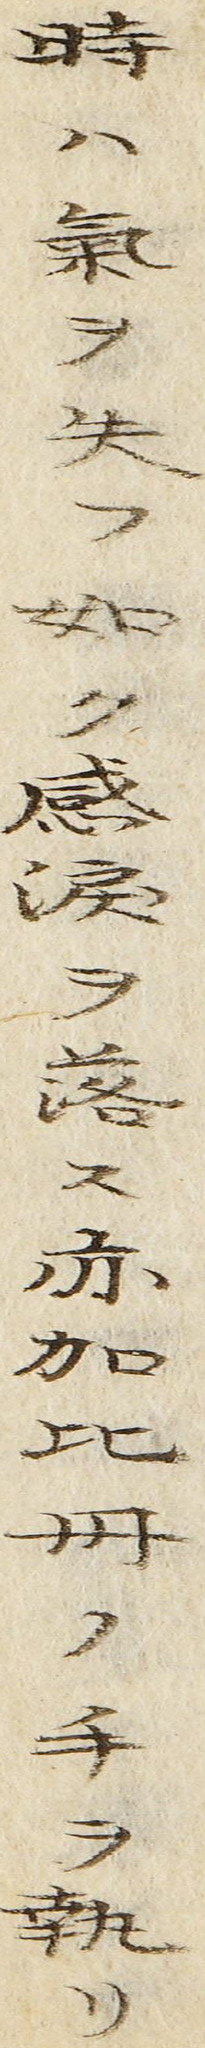時ハ気ヲ失フ如ク感涙ヲ落ス亦加比丹ノ手ヲ執リ
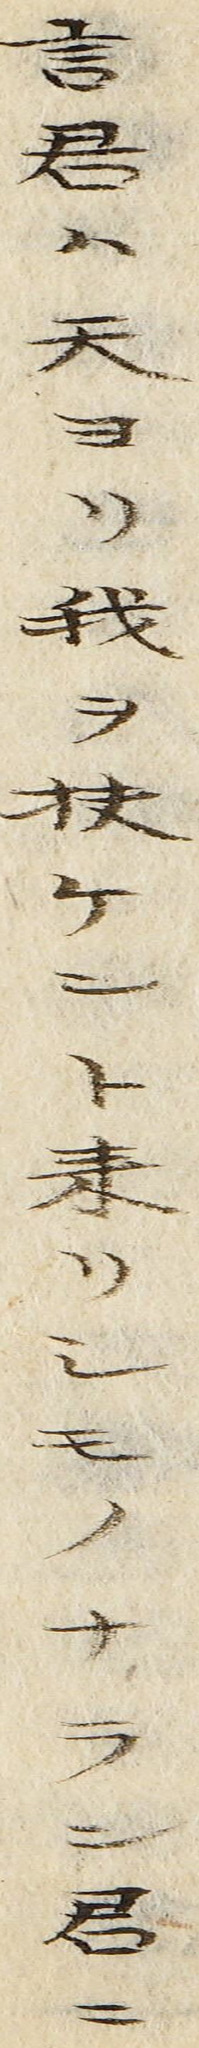言君ハ天ヨリ我ヲ扶ケント来リシモノナラン君ニ
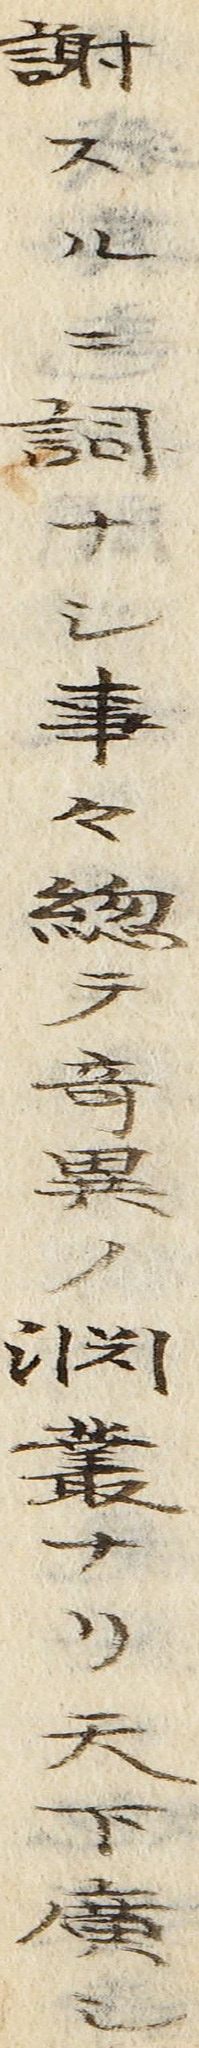謝スルニ詞ナシ事々総テ奇異ノ淵叢ナリ天下広シ
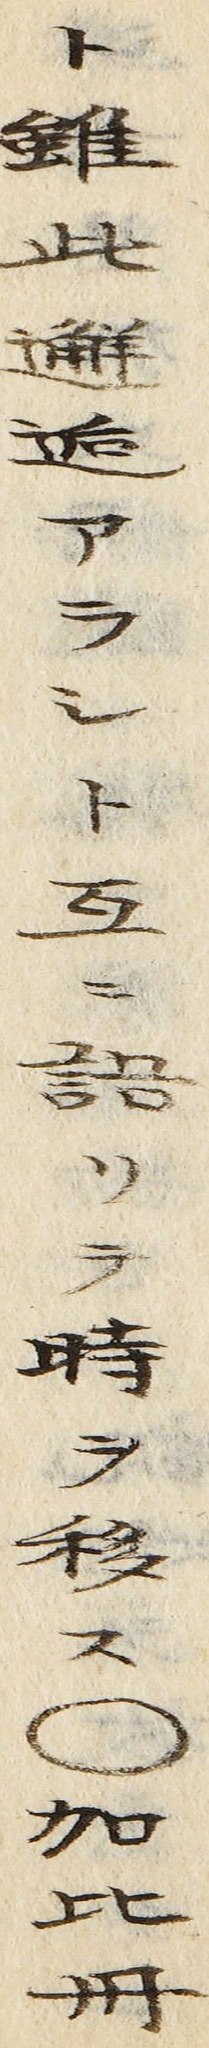ト雖此邂逅アラシト互ニ語リテ時ヲ移ス◯加比丹
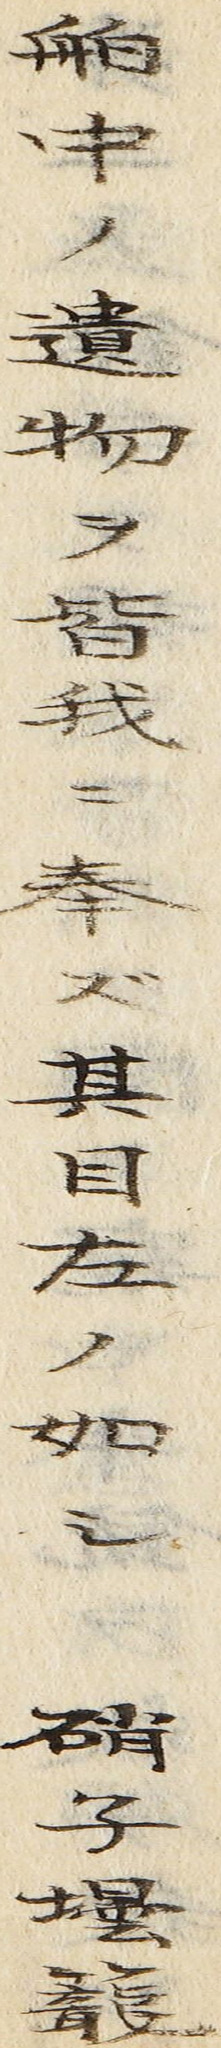舶中ノ遺物ヲ皆我ニ奉ズ其目左ノ如シ硝子壜籠
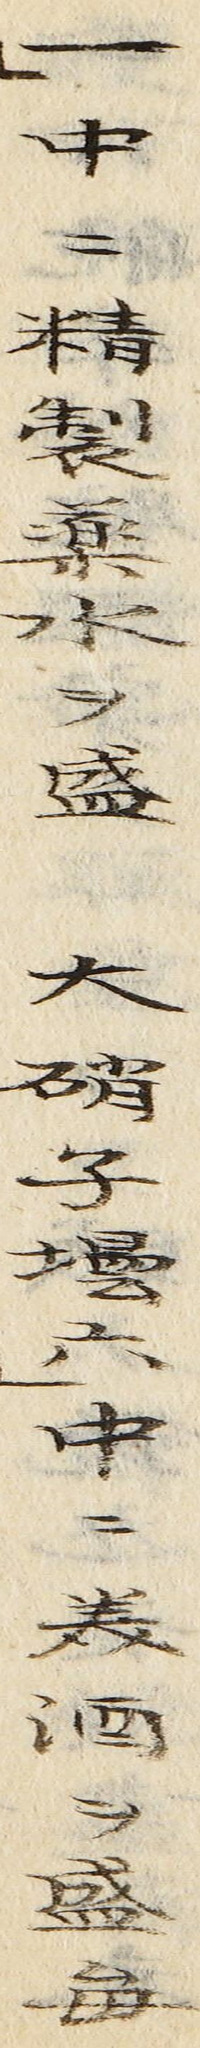一」中ニ精製薬水ヲ盛大硝子壜六」中に美酒ヲ盛毎
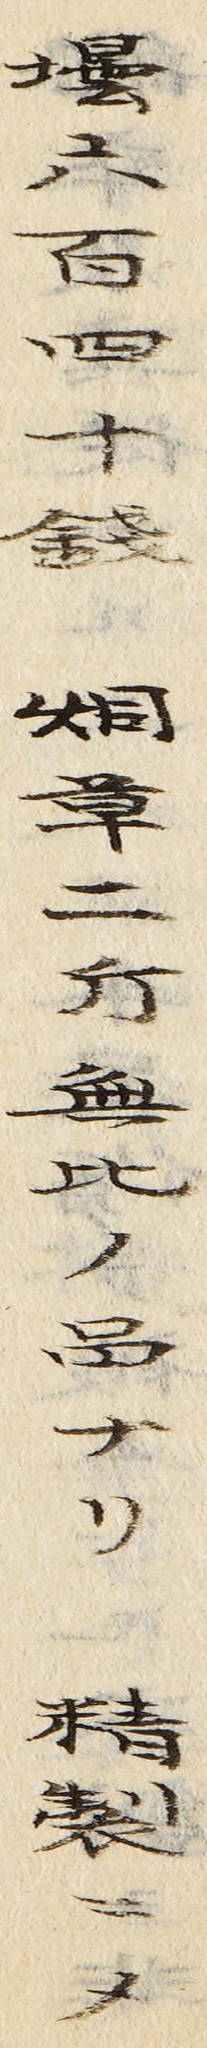壜六百四十銭煙草二斤無比ノ品ナリ精製ニシテ
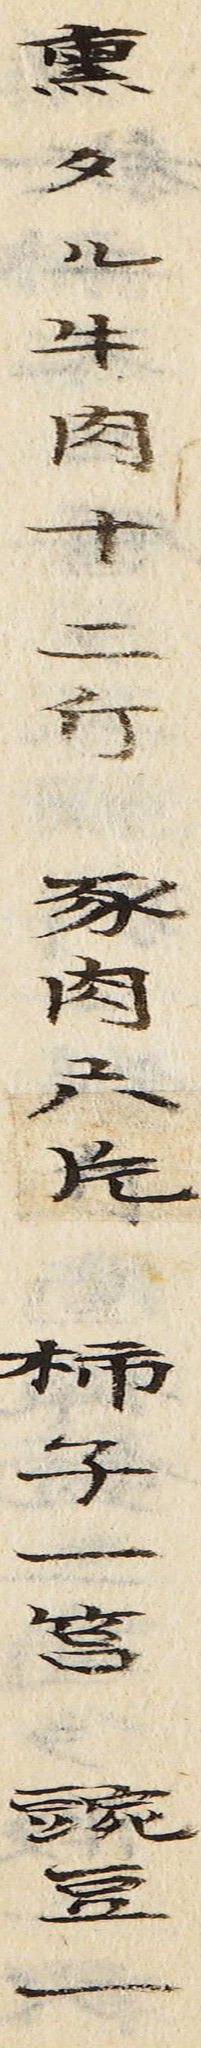薫タル牛肉十二斤豕肉六片柿子一筥豌豆一
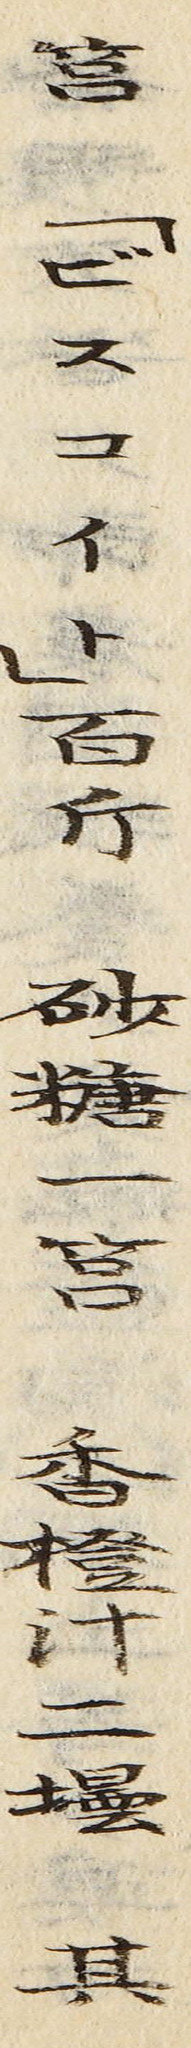筥「ビスコイト」百斤砂糖一筥香橙汁二壜其
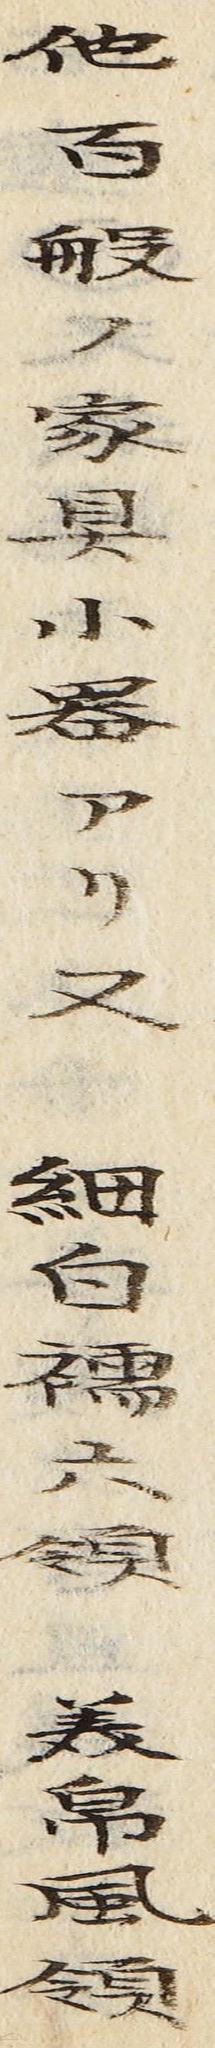他百般ノ家具小器アリ又細白襦六領美帛風領
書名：漂流紀事
